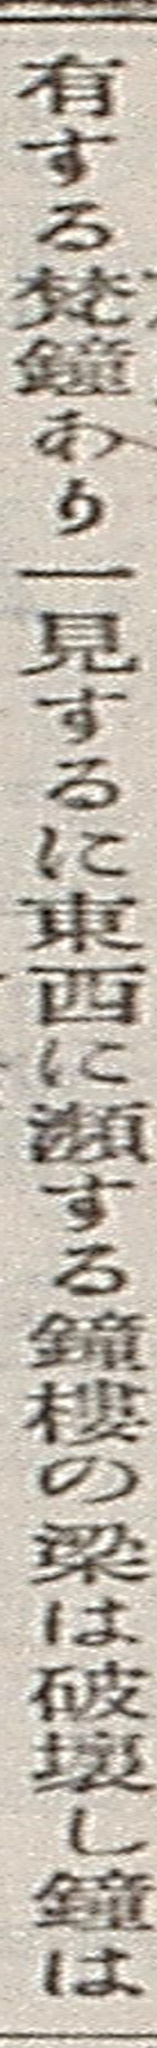有する梵鐘あり一見するに東西に瀕する鐘楼の梁は破壊し鐘は
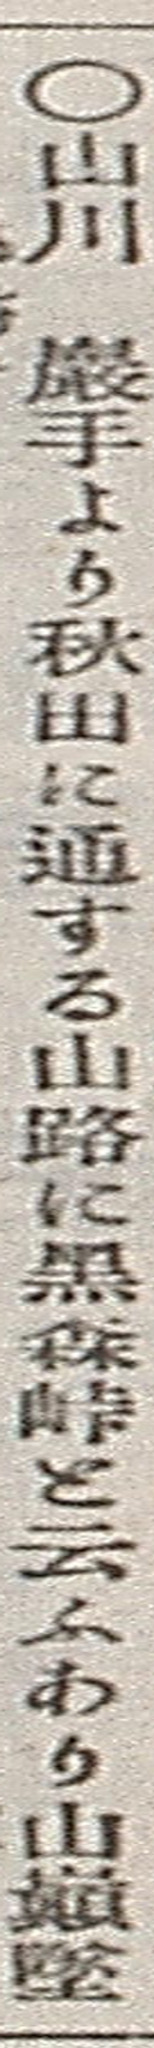〇山川岩手より秋田に通ずる山路に黒森峠と云ふあり山嶺墜
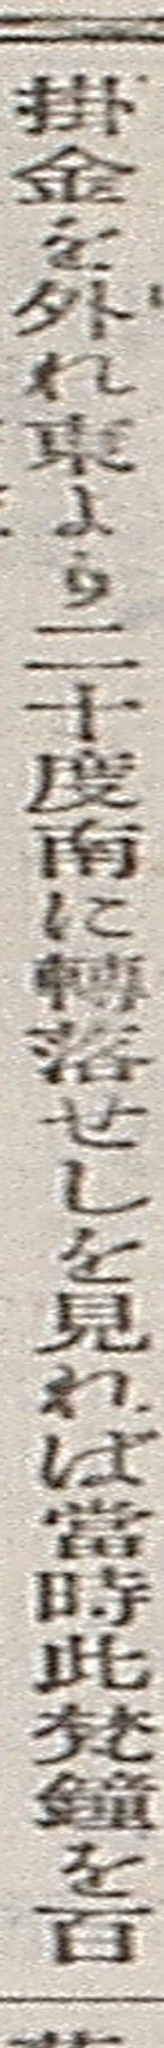掛金を外れ東より二十度南に転落せしを見れば当時此梵鐘を百
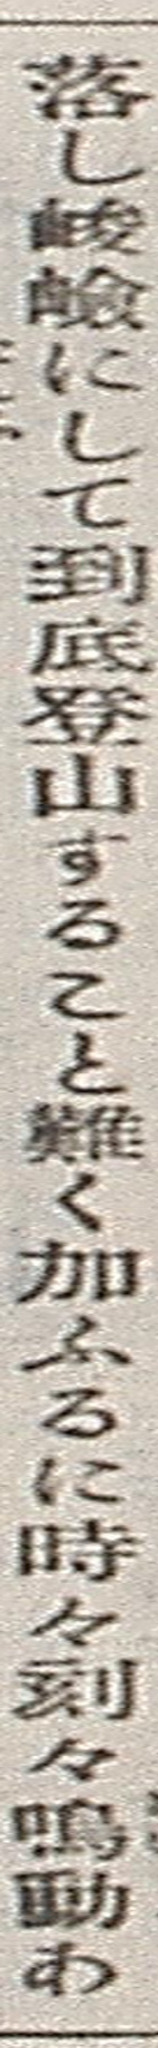落し峻険にして到底登山すること難く加ふるに時々刻々鳴動あ
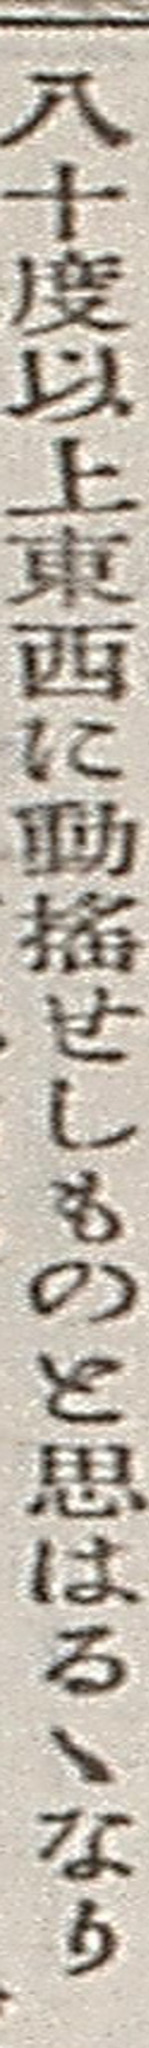八十度以上東西に動揺せしものと思はるゝなり
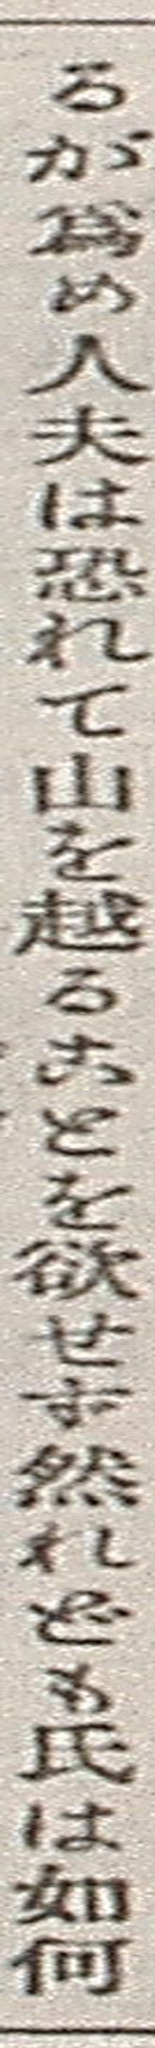るが為め人夫は恐れて山を越ることを欲せず然れども氏は如何
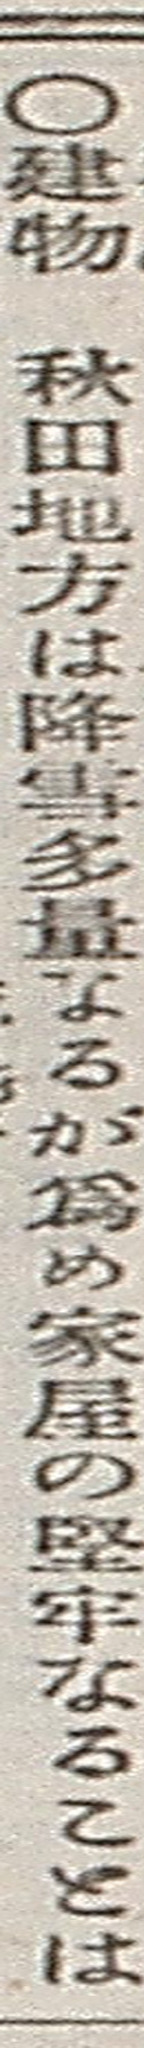〇建物秋田地方は降雪多量なるが為め家屋の堅牢なることは
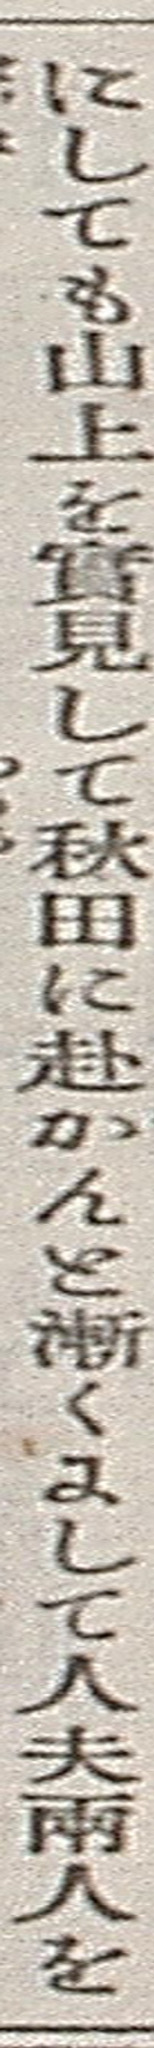にしても山上を実見して秋田に赴かんと漸くにして人夫両人を
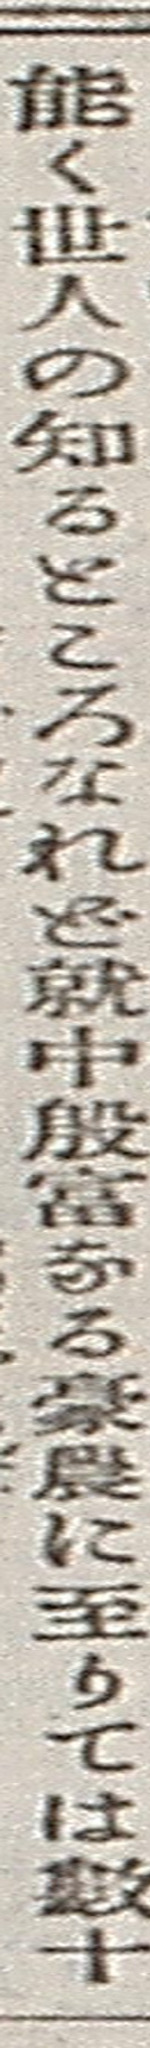能く世人の知るところなれど就中殷富なる豪農に至りては数十
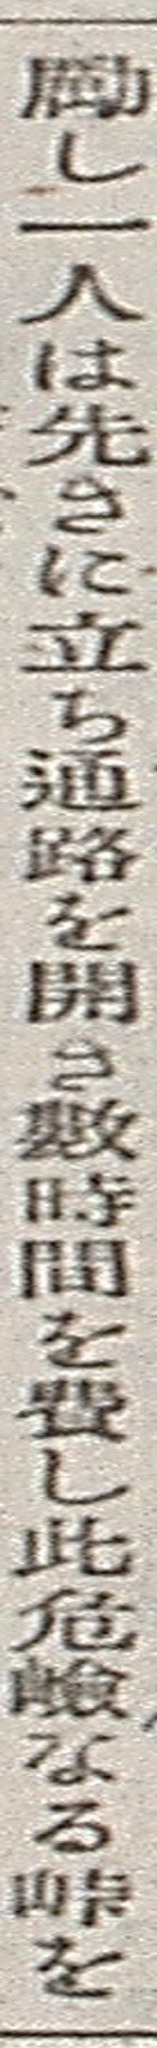励し一人は先きに立ち通路を開き数時間を費し此危険なる峠を
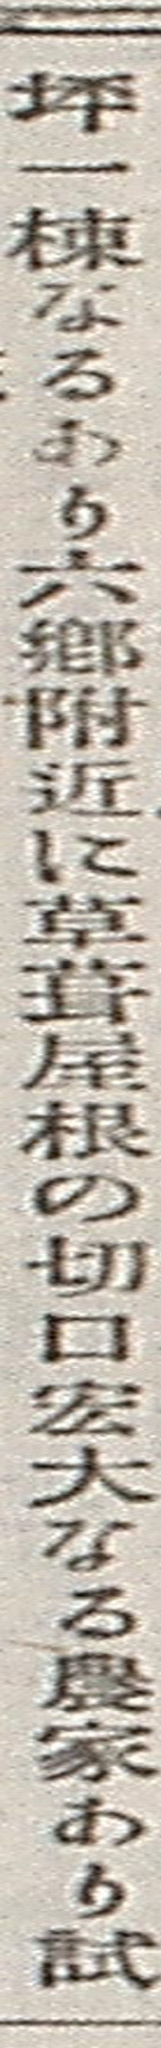坪一棟なるあり六郷附近に草葺屋根の切口宏大なる農家あり試
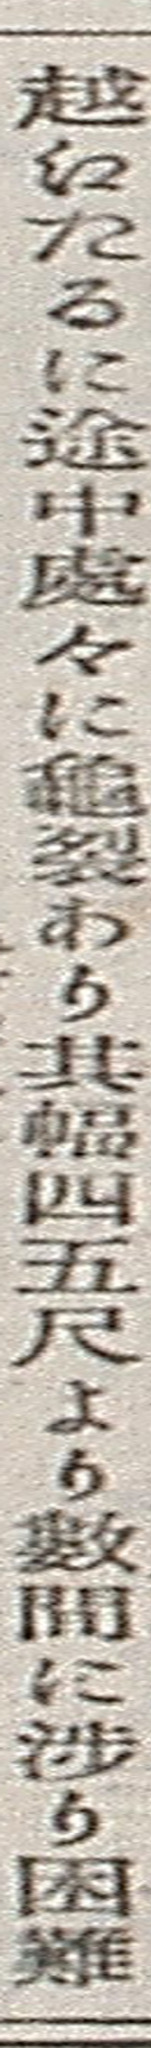越えたるに途中処々に亀裂あり其幅四五尺より数間に渉り困難
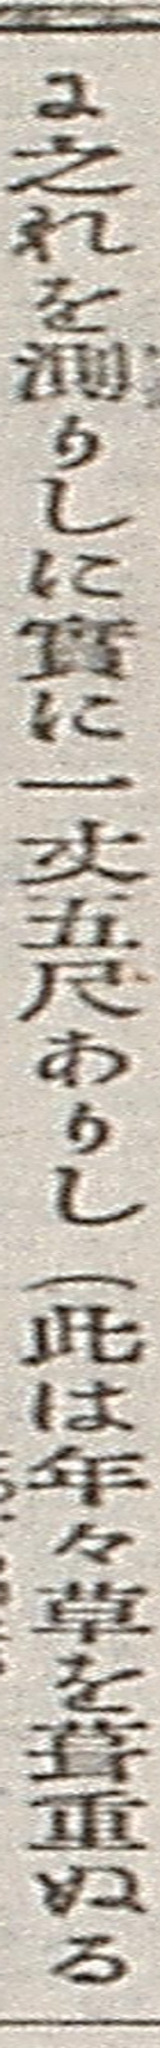に之れを測りしに実に一丈五尺ありし（此は年々草を葺重ぬる
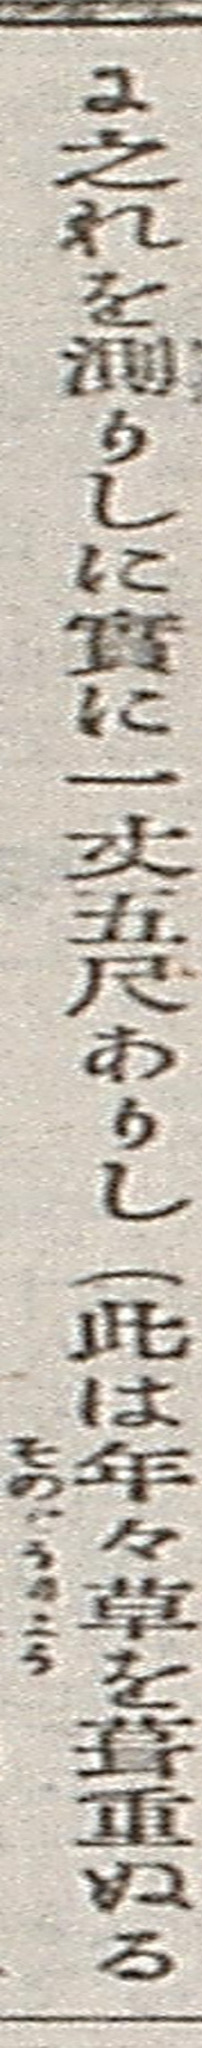に之れを測りしに実に一丈五尺ありし（此は年々草を葺重ぬる
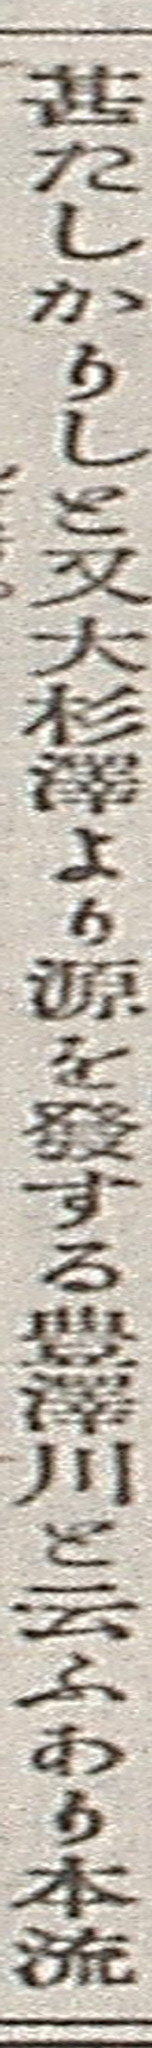甚たしかりしと又大杉沢より源を発する豊沢川と云ふあり本流
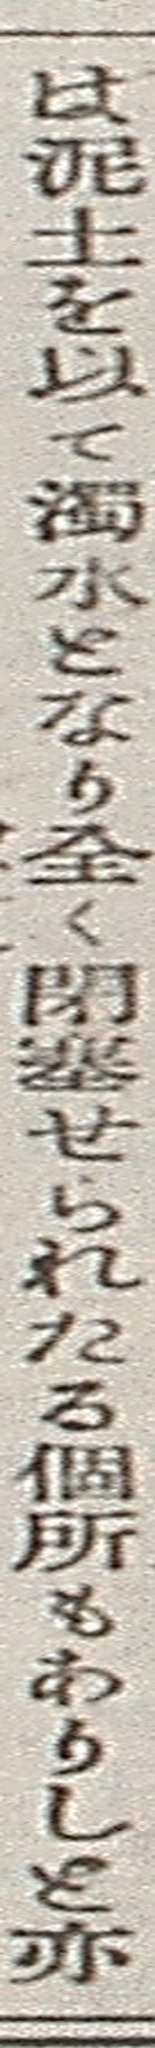は泥土を以て濁水となり全く閉塞せられたる個所もありしと亦
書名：風俗畫報臨時増刊第百二十四號　洪水地震被害録（上）
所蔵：東京大学地震研究所図書室 Earthquake Research Institute Library, The University of Tokyo, JAPAN
